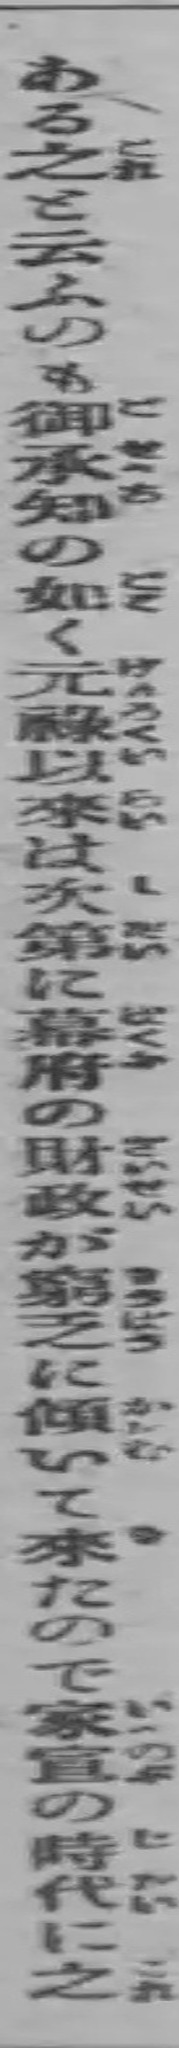ある之と云ふのも御承知の如く元禄以来は次第に幕府の財政が窮乏に傾いて来たので家宣の時代に之

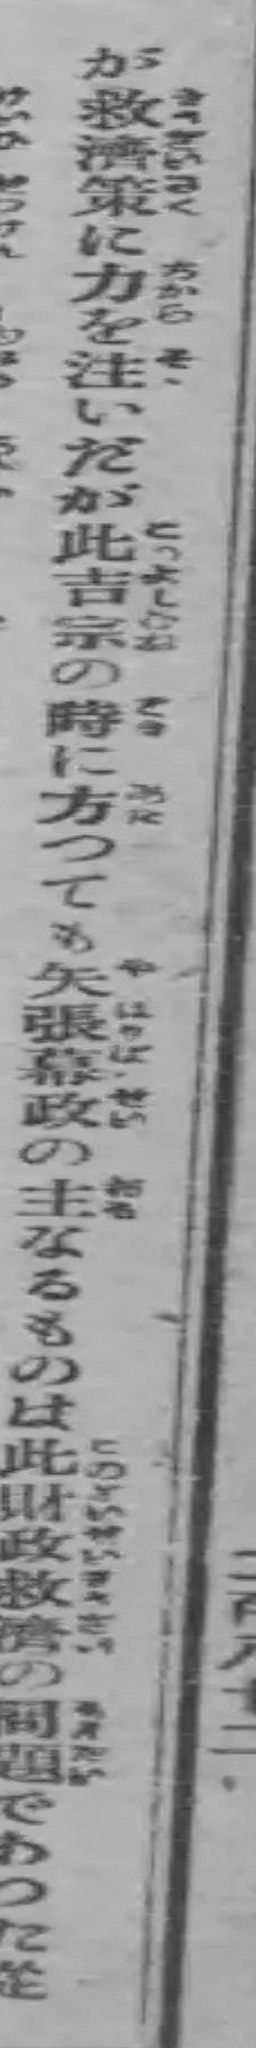が救済策に力を注いだが此吉宗の時に方つても矢張幕政の主なるものは此財政救済の問題であつた従
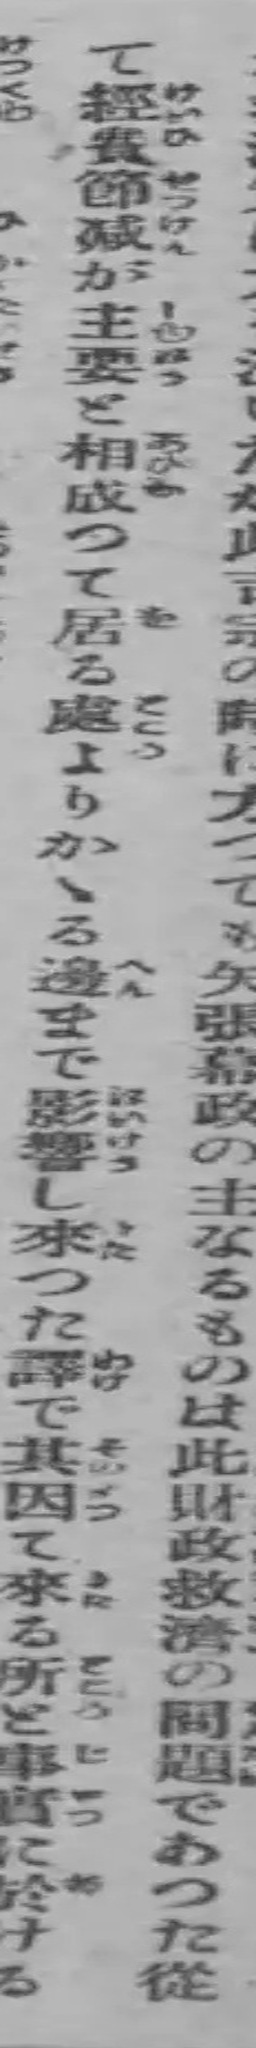て経費節減が主要と相成つて居る処よりかゝる辺まで影響し来つた訳で其因て来る所と事実に於ける
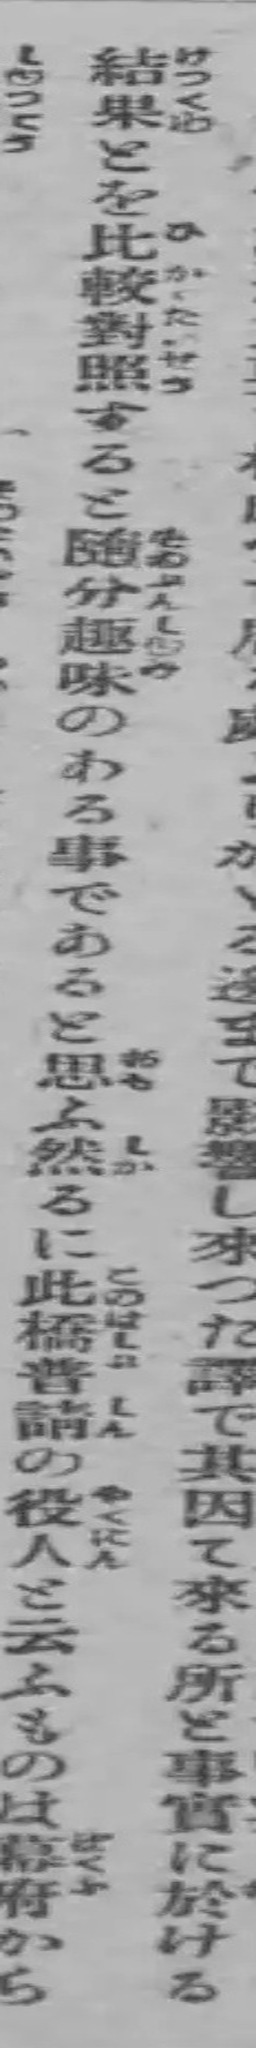結果とを比較対照すると随分趣味のある事であると思ふ然るに此橋普請の役人と云ふものは幕府から
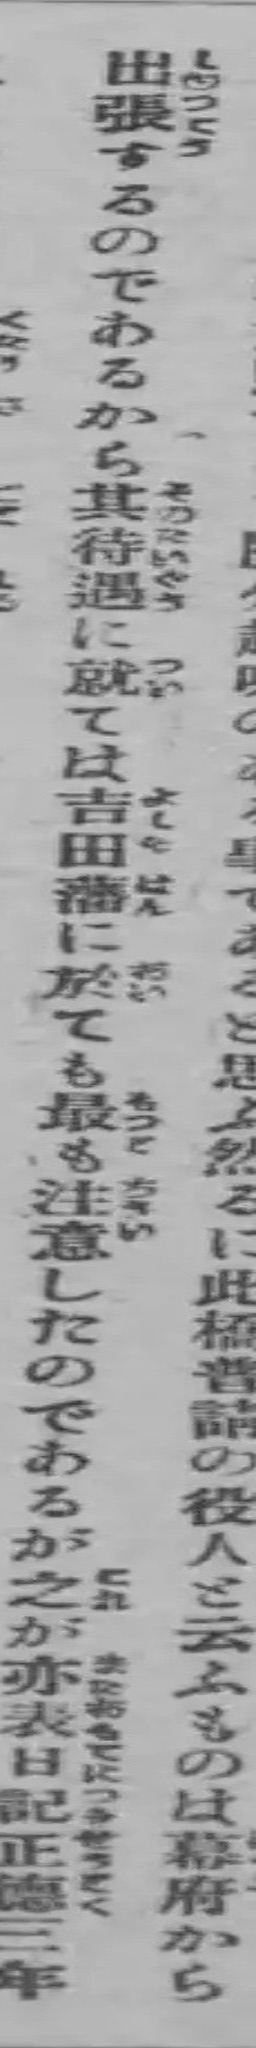出張するのであるから其待遇に就ては吉田藩に於ても最も注意したのであるが之が亦表日記正徳三年
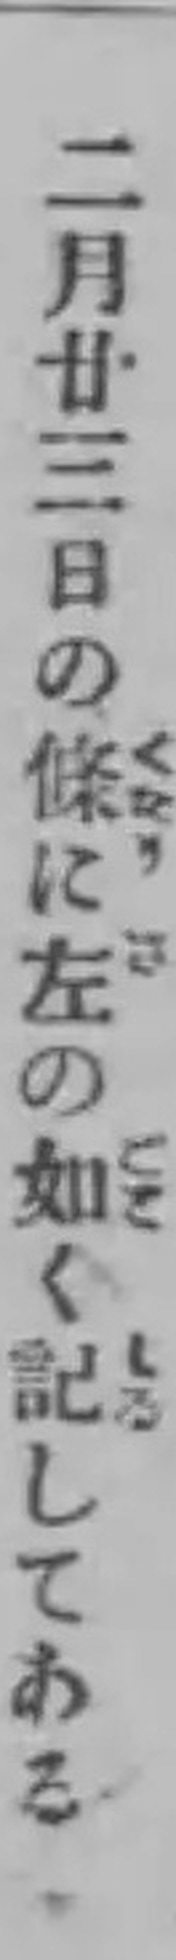二月廿三日の條に左の如く記してある
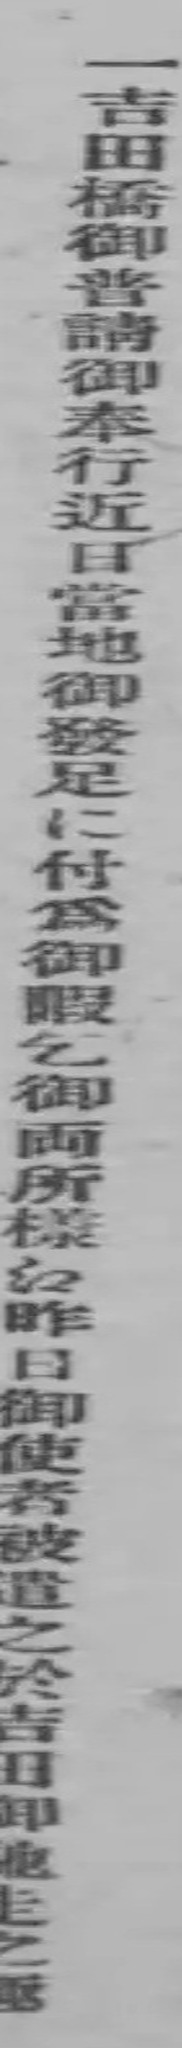一吉田橋御普請御奉行近日当地御発足に付為御暇乞御両所様え昨日御使者被遣之於吉田御馳走之趣
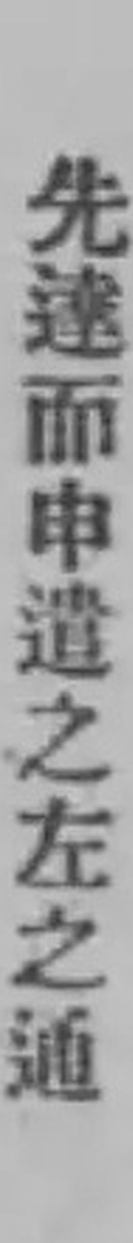先達而申遣之左之通
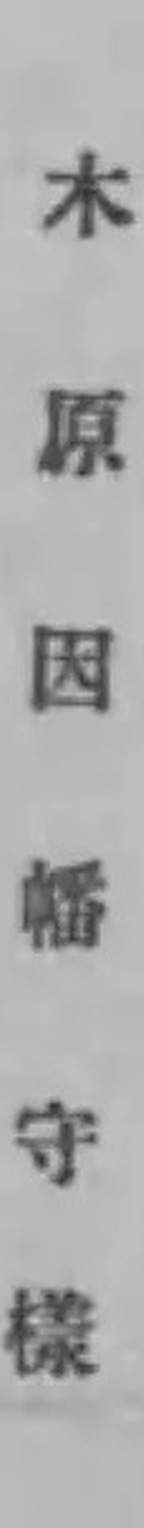木原因幡守様
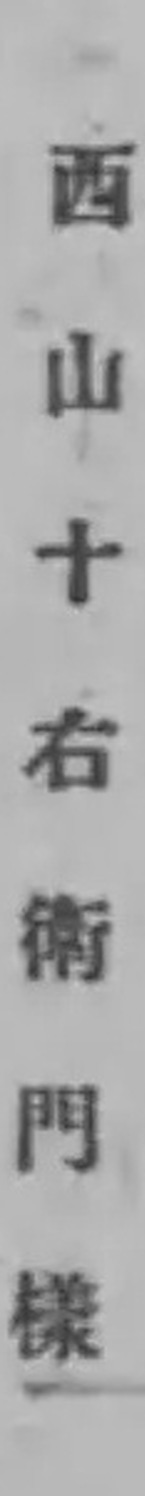西山十右衛門様
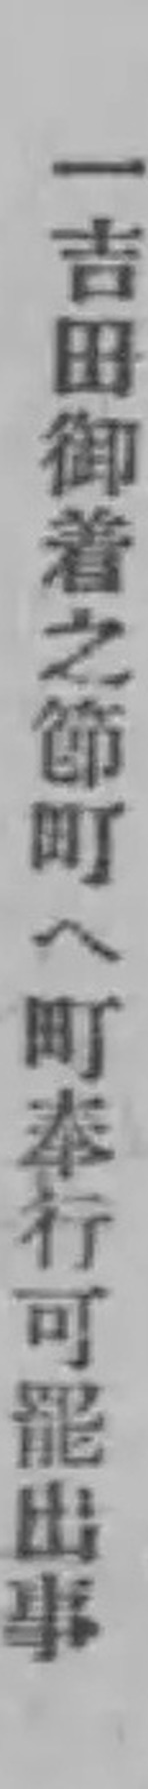一吉田御着之節町へ町奉行可罷出事
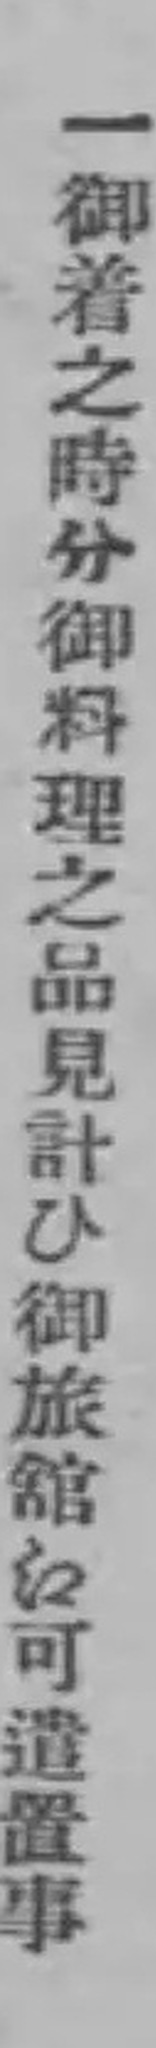一御着之時分御料理之品見計ひ御旅館え可遣置事
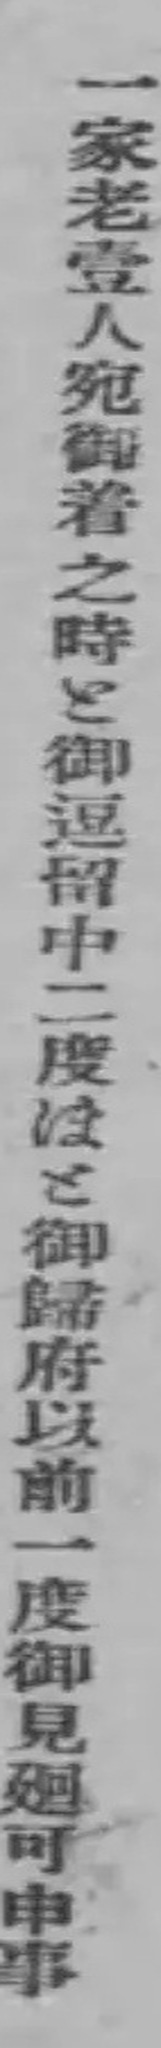一家老壱人宛御着之時と御逗留中二度ほと御帰府以前一度御見廻可申事
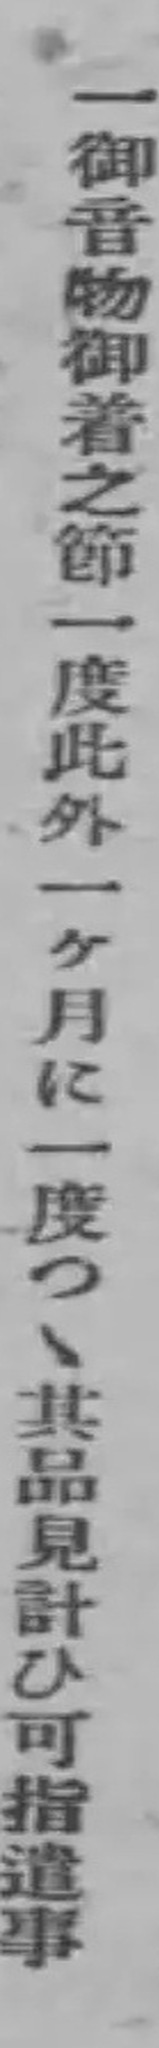一御音物御着之節一度此外一ヶ月に一度つゝ其品見計ひ可指遣事
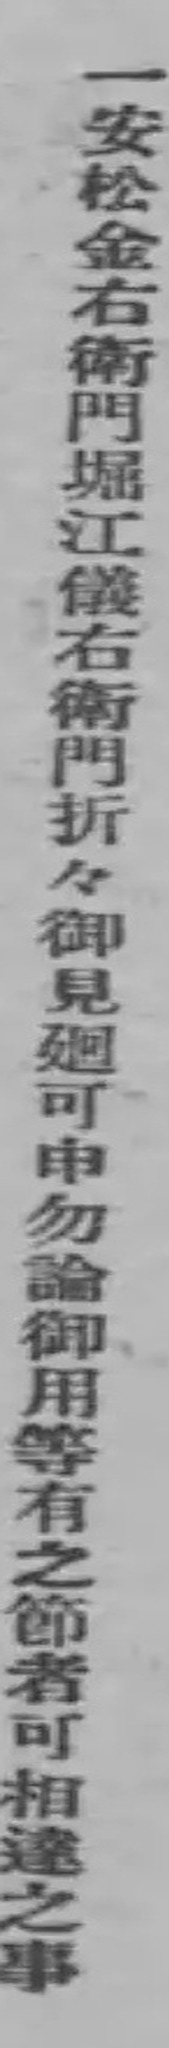一安松金右衛門堀江儀右衛門折々御見廻可申勿論御用等有之節者可相達之事
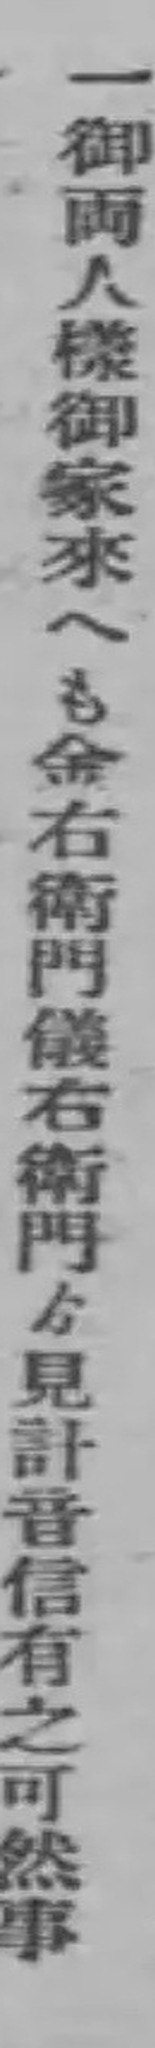一御両人様御家来へも金右衛門儀右衛門ゟ見計音信有之可然事
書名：豊橋市史談
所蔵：国立国会図書館 National Diet Library, JAPAN
